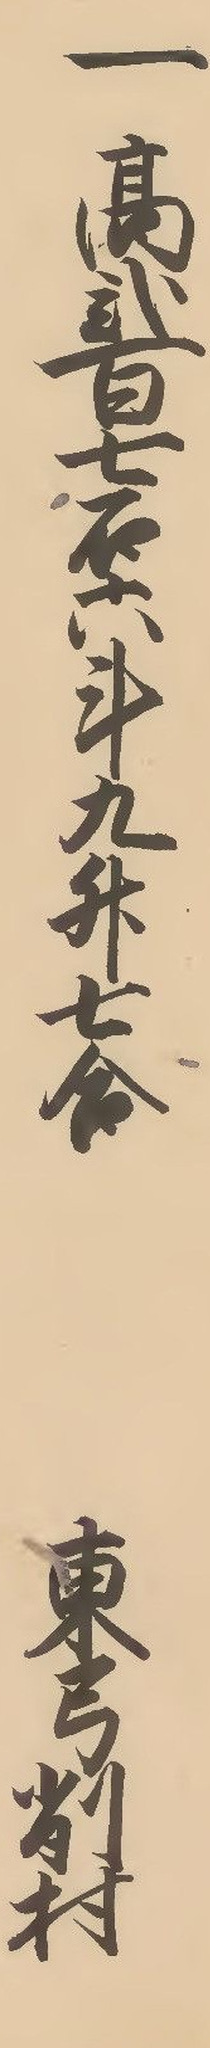一高弐百七石六斗九升七合東弓削村
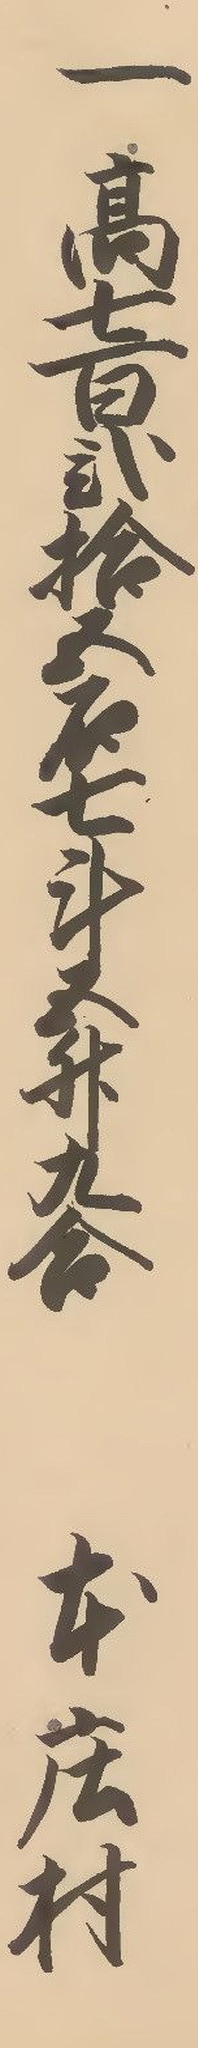一高七百弐拾五石七斗五升九合本庄村
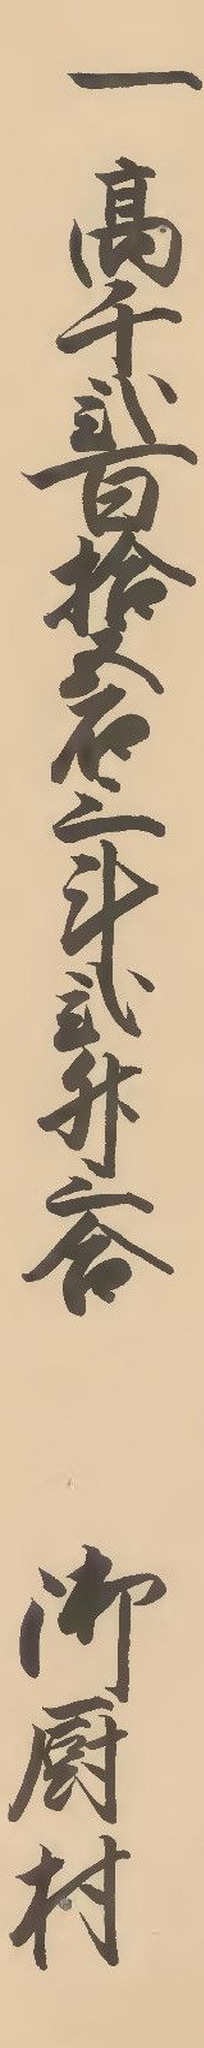一高千弐百拾五石三斗弐升三合御厨村
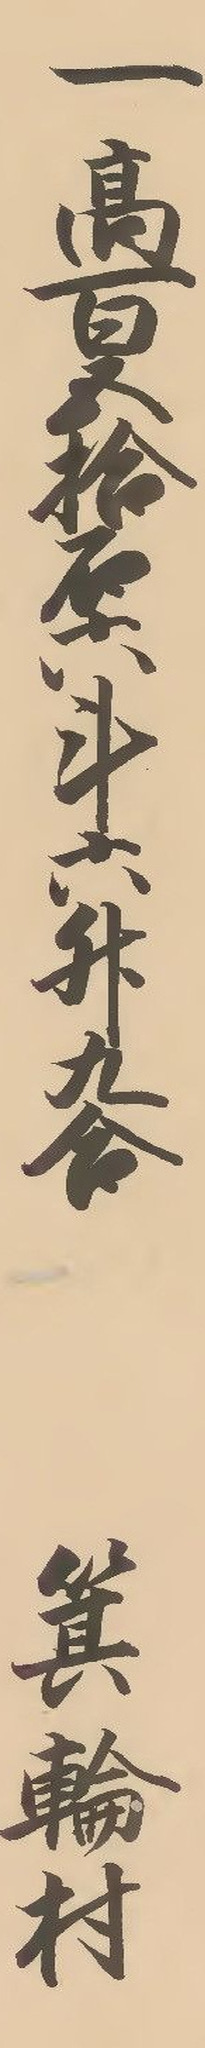一高百五拾石六斗六升九合箕輪村
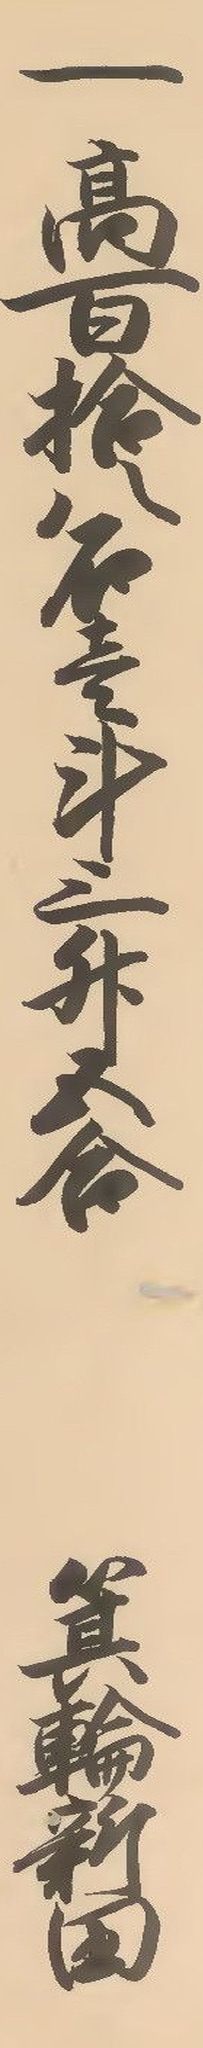一高百拾八石壱斗三升五合箕輪新田
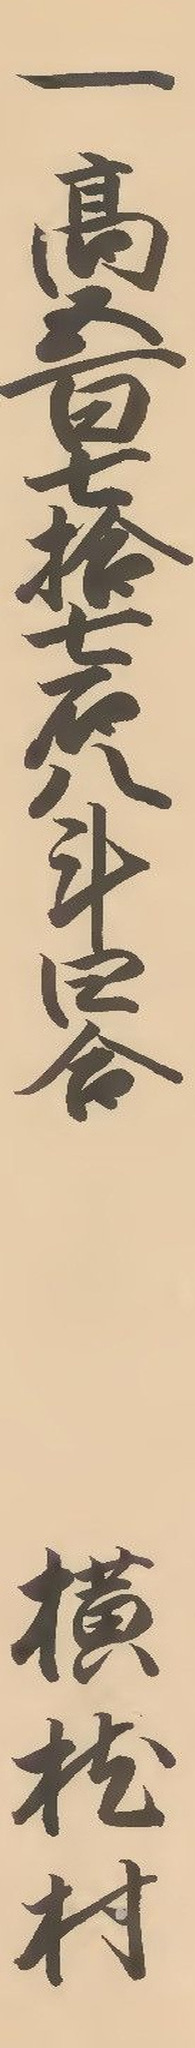一高五百七拾七石八斗四合横枕村
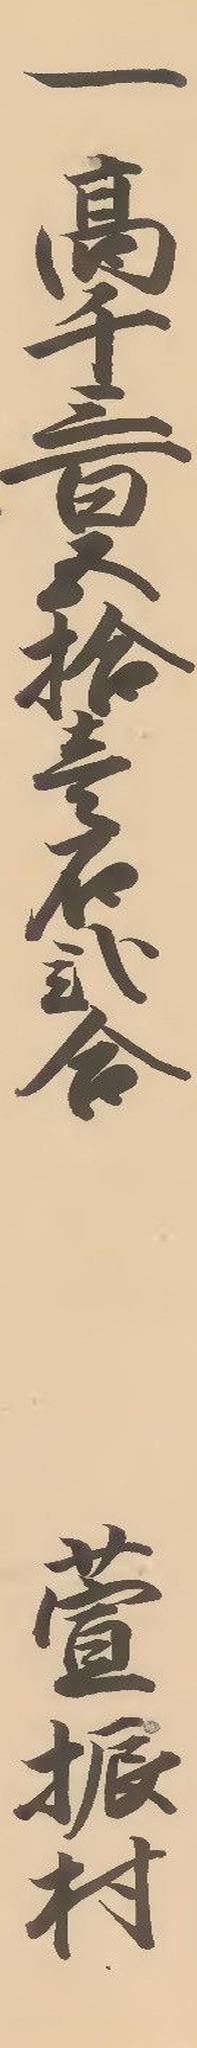一高千三百五拾壱石弐合萱振村
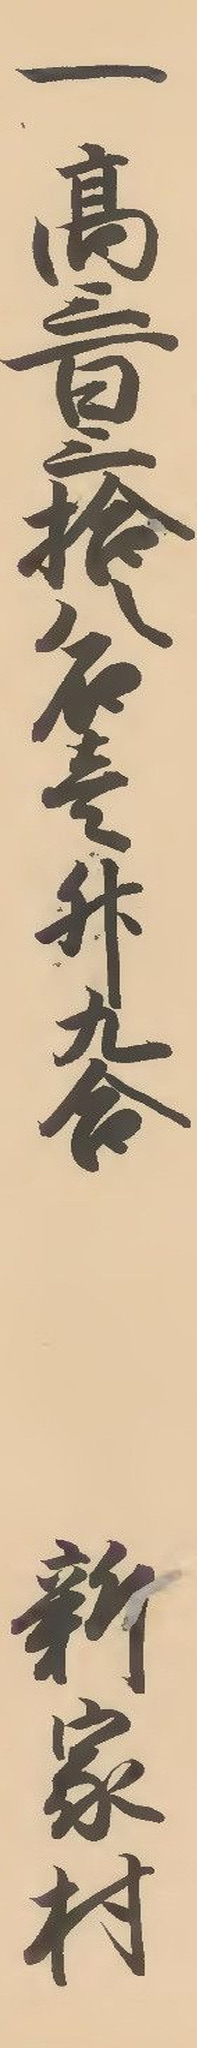一高三百三拾八石壱升九合新家村

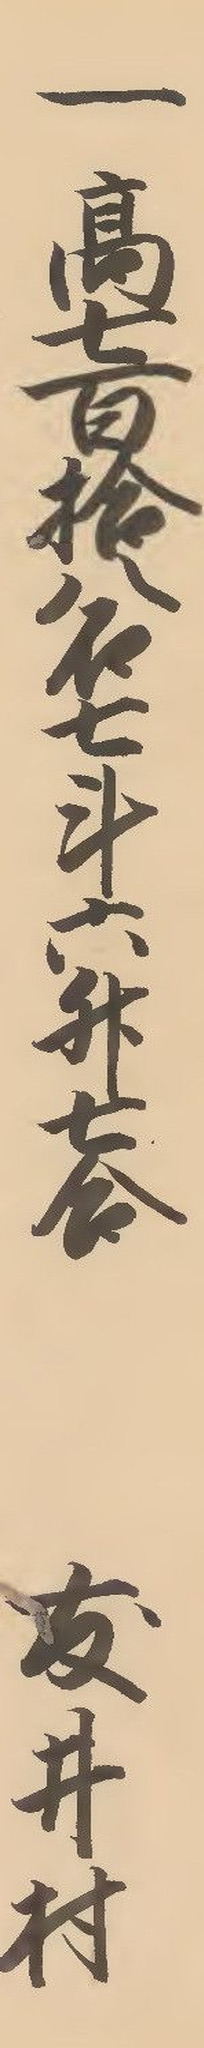一高七百拾八石七斗六升七合友井村
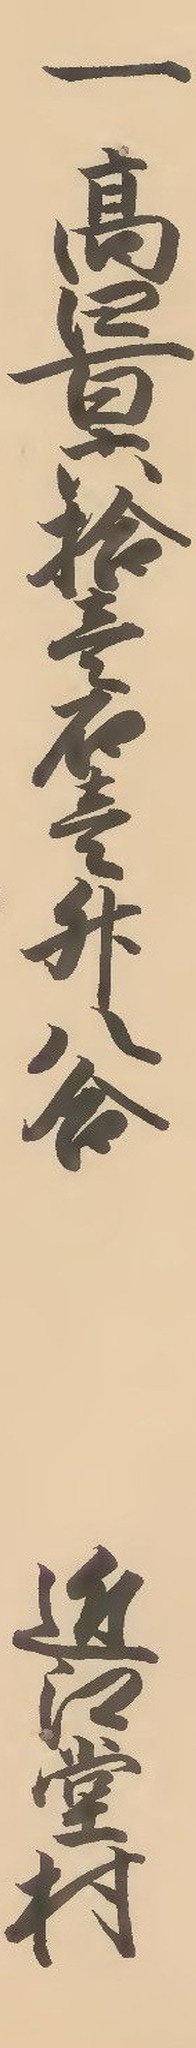一高四百六拾壱石壱升八合近江堂村
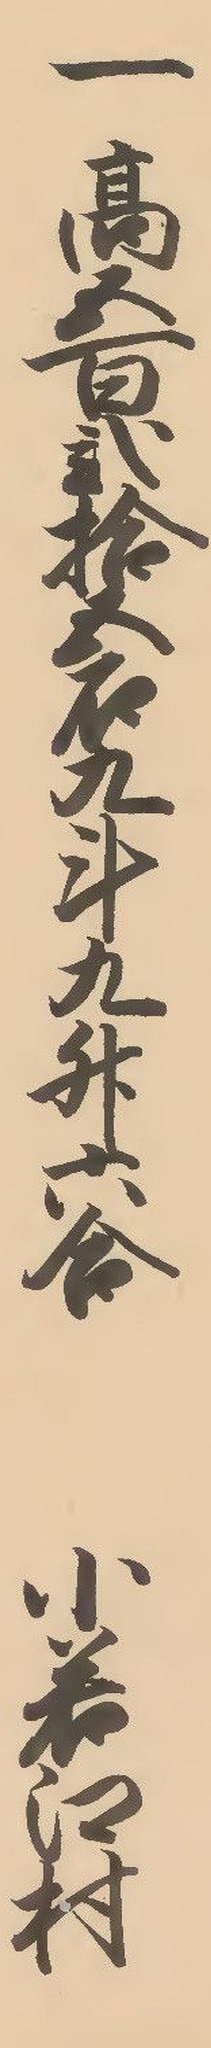一高五百弐拾五石九斗九升六合小若江村
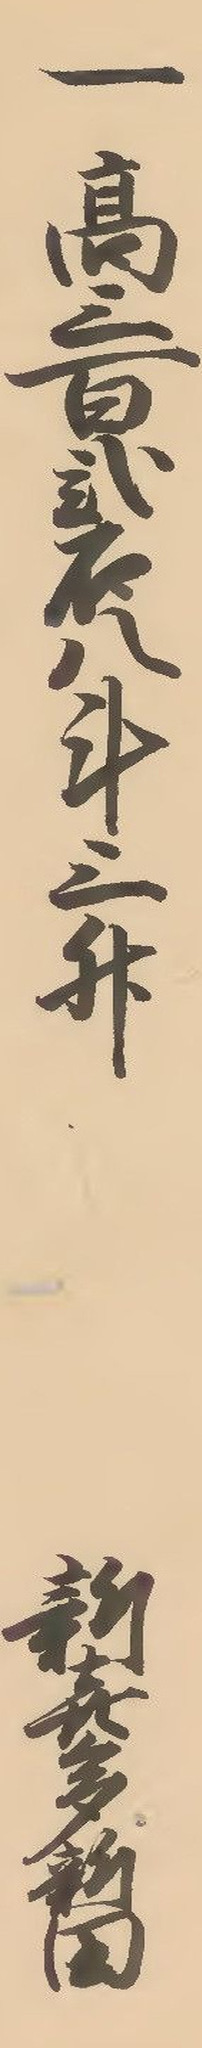一高三百弐石八斗三升新喜多新田
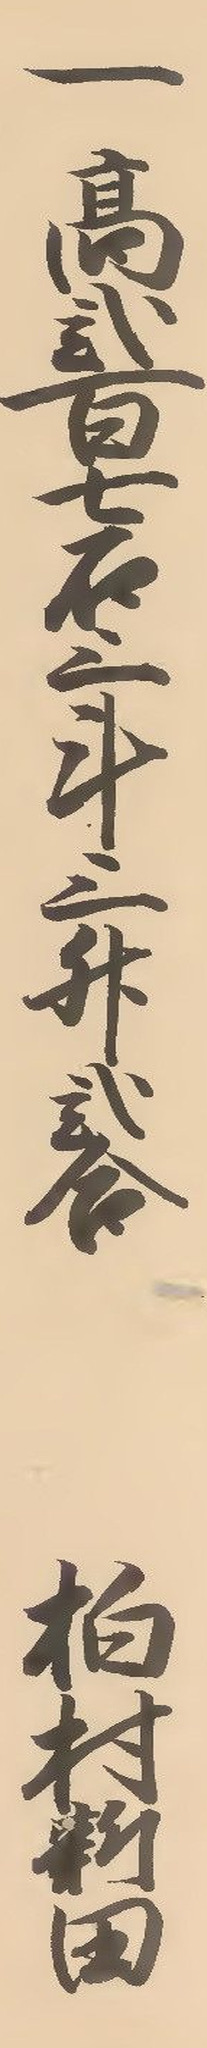一高弐百七石三斗三升弐合柏村新田
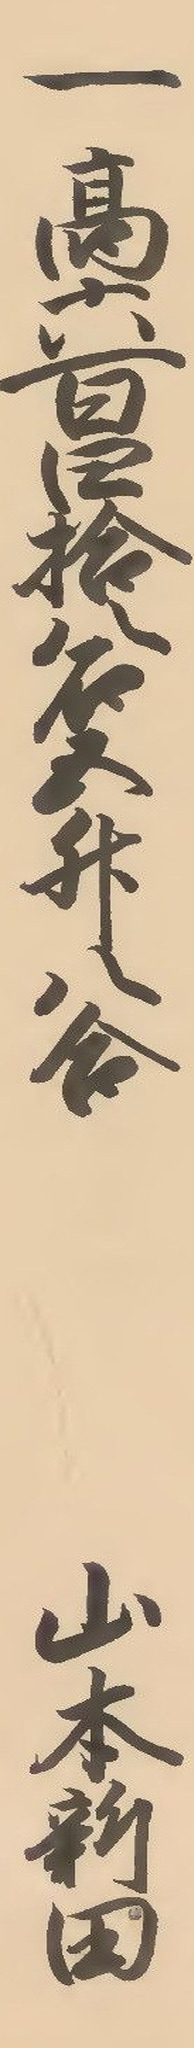一高六百四拾八石五升八合山本新田
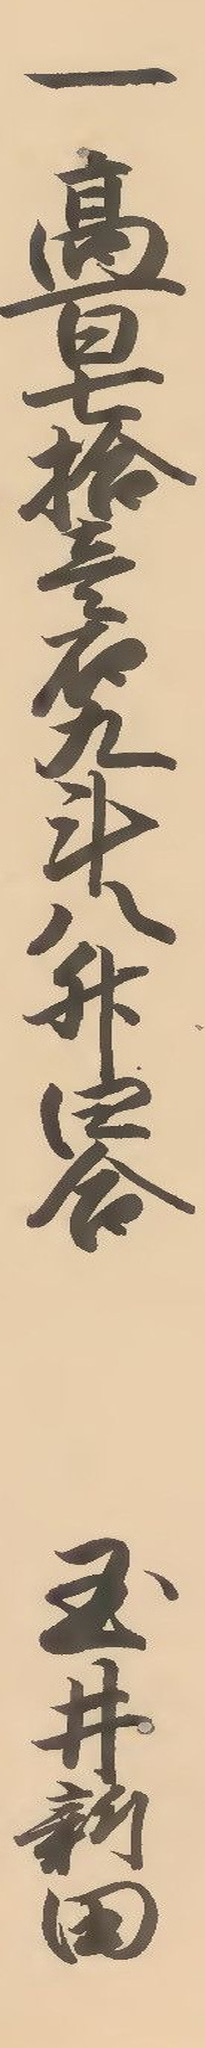一高百七拾壱石九斗八升四合玉井新田
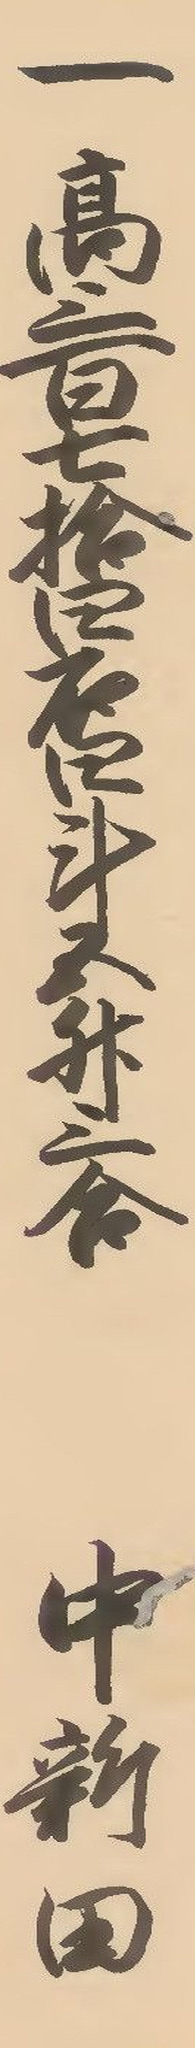一高三百七拾四石四斗五升三合中新田
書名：河内国郷帳
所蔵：国立公文書館 National Archives of Japan
